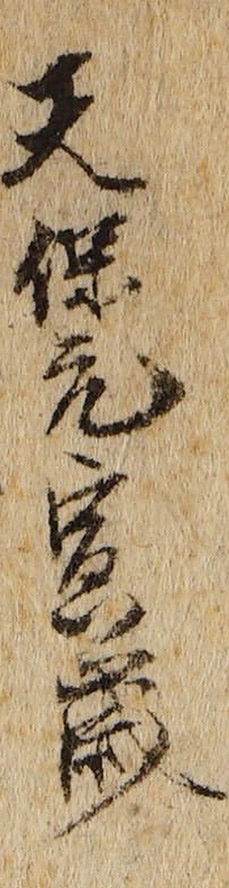天保元寅年

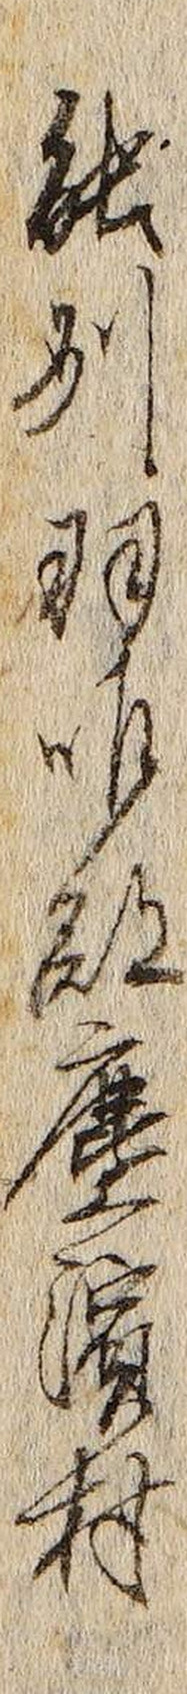能州羽咋郡塵浜村
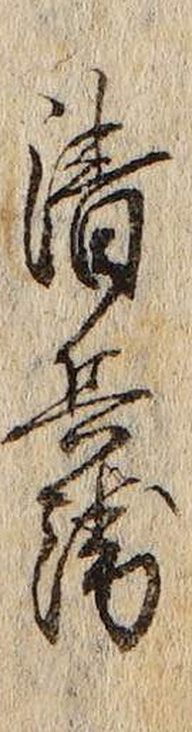清兵衛
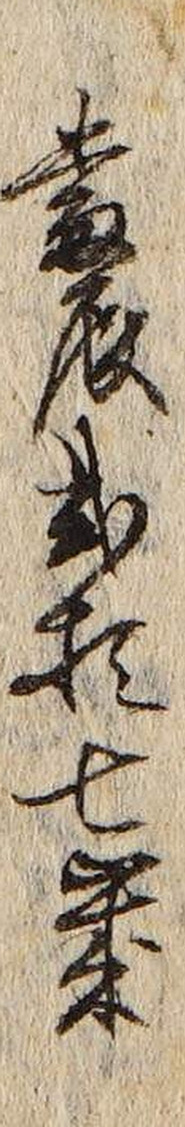当辰弐拾七歳
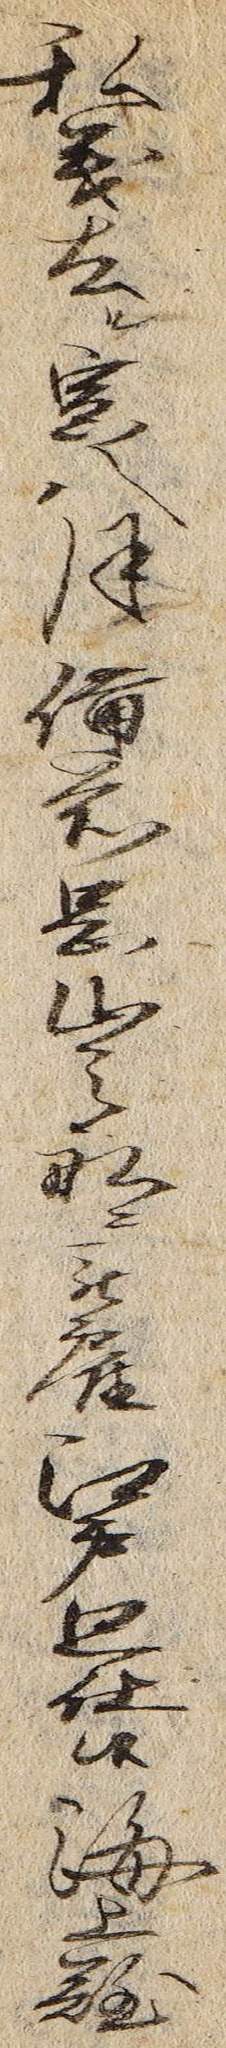私儀去ル寅八月備前岡山の船に被雇江戸廻仕候海上難
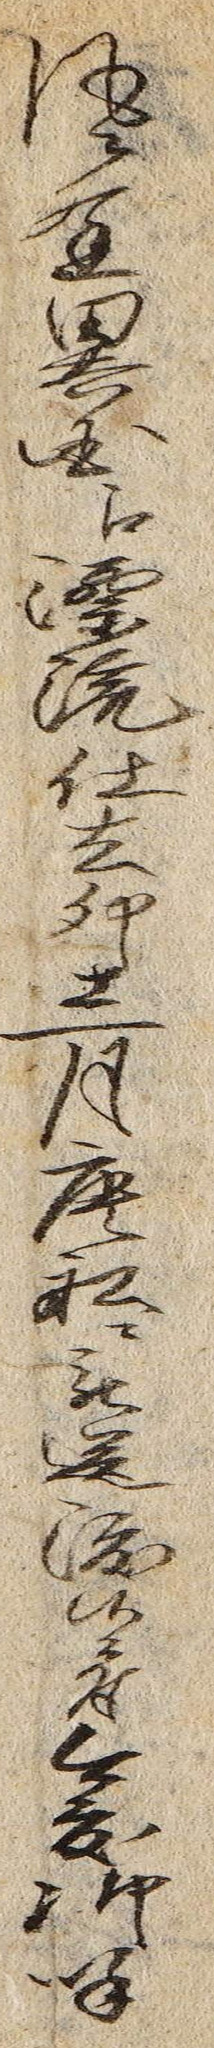風に逢異国へ漂流仕去卯十二月唐船に被送渡候に付今度御呼
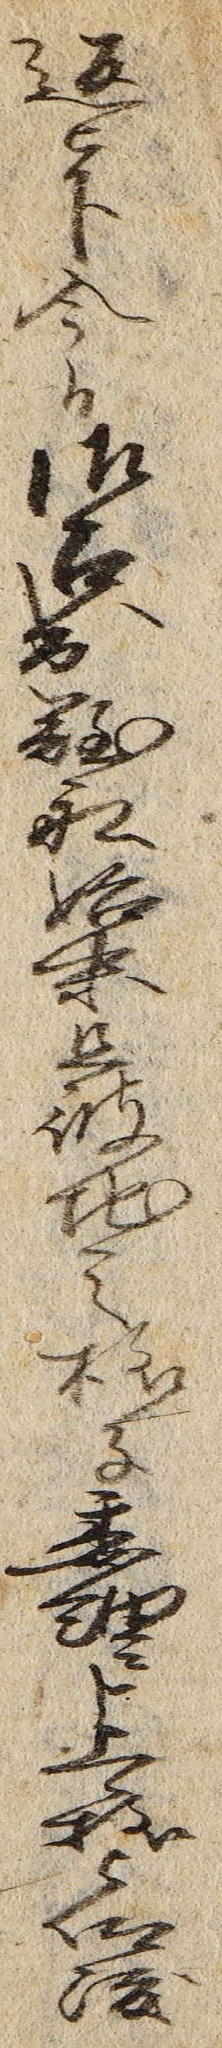返被下今日御召出難船始末且彼地の様子委細に申上候様被仰渡
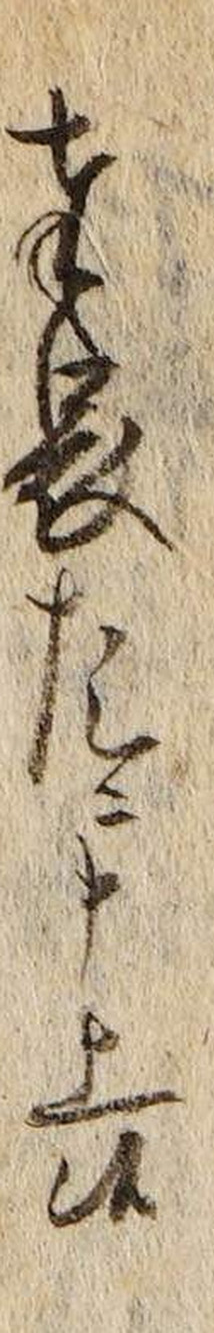奉畏左に申上候
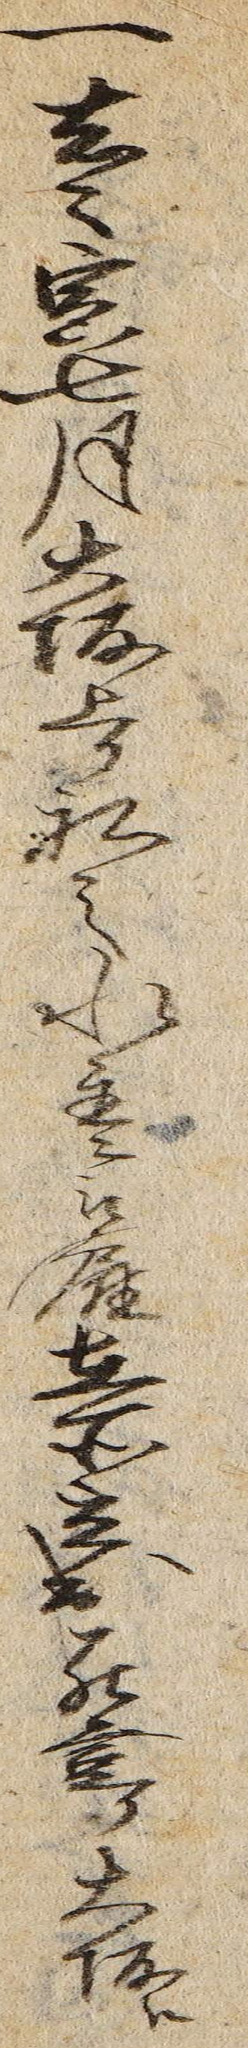一去々寅七月大坂上り船の水主に被雇在所立出罷登り大坂え
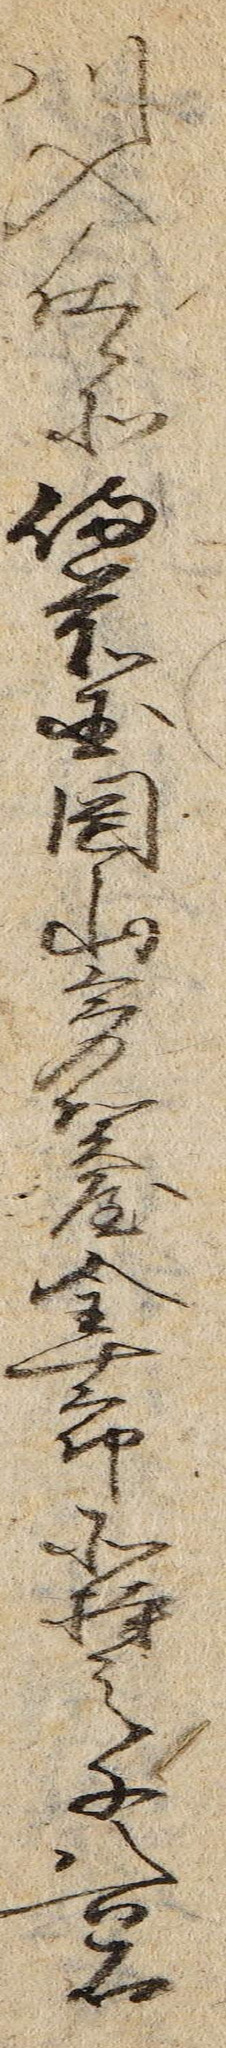川入仕候所備前国岡山多賀屋金十郎所持の千八百石
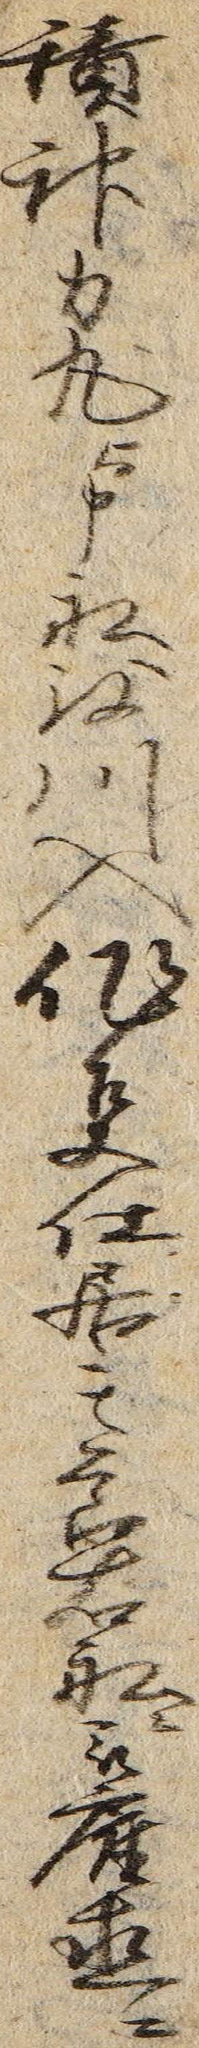積神力丸と申船致川入作事仕居其節右船に被雇直に
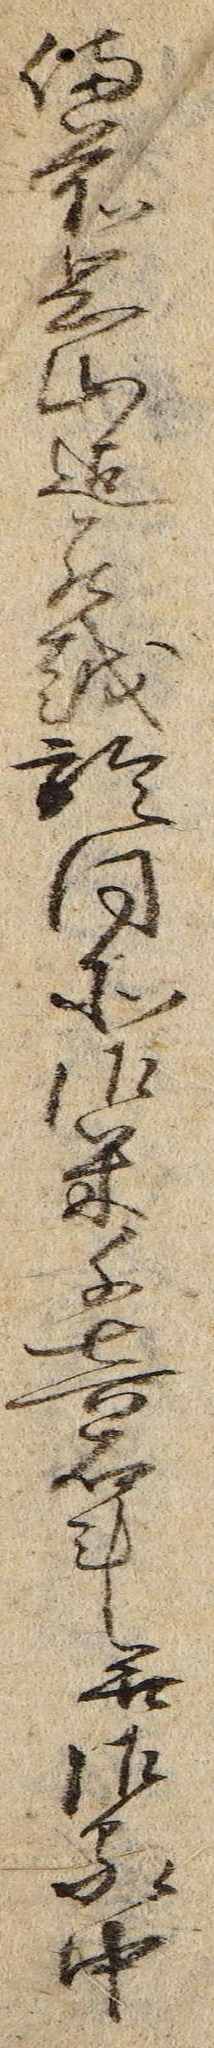備前岡山迄罷越於同所御米千七百石斗并御家中

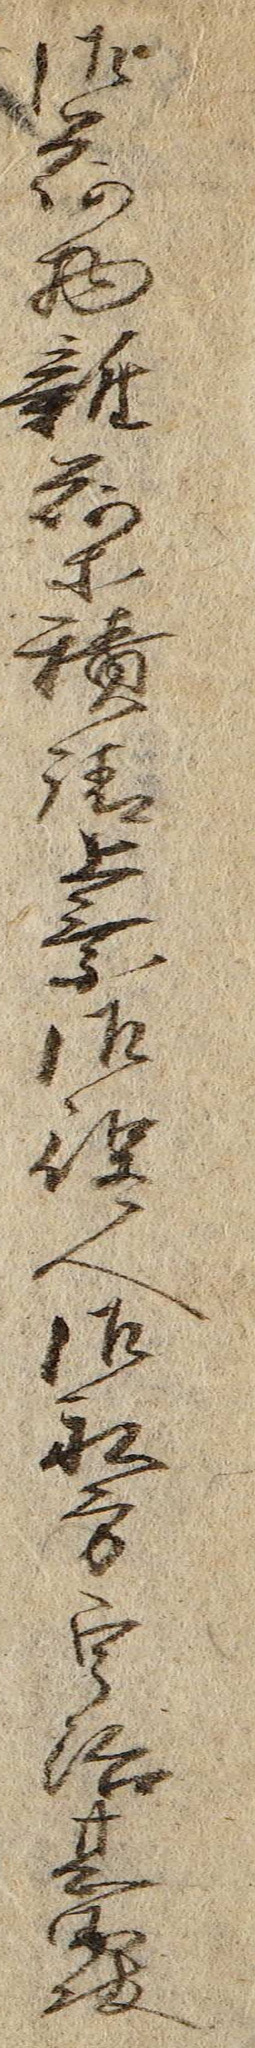御荷物雑荷等積請上乗御役人御船方宇治甚助殿
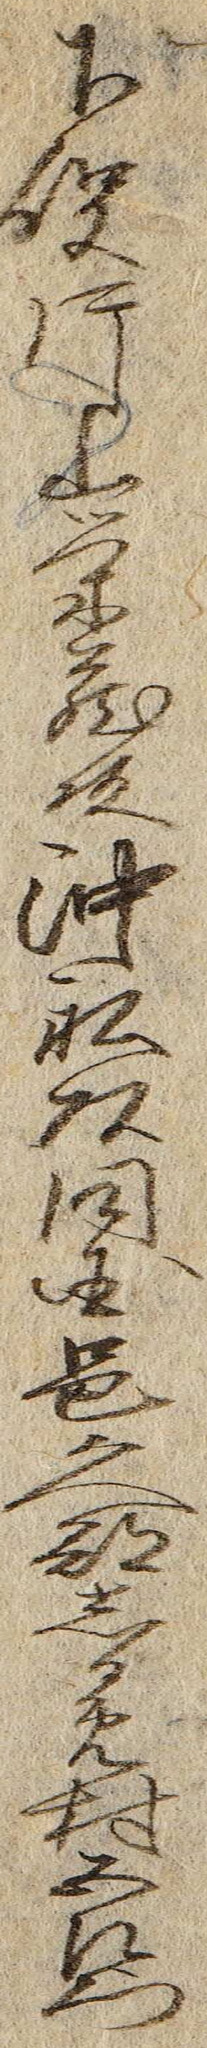下役片山栄蔵殿沖船頭同国邑久郡しるめ村五左衛門
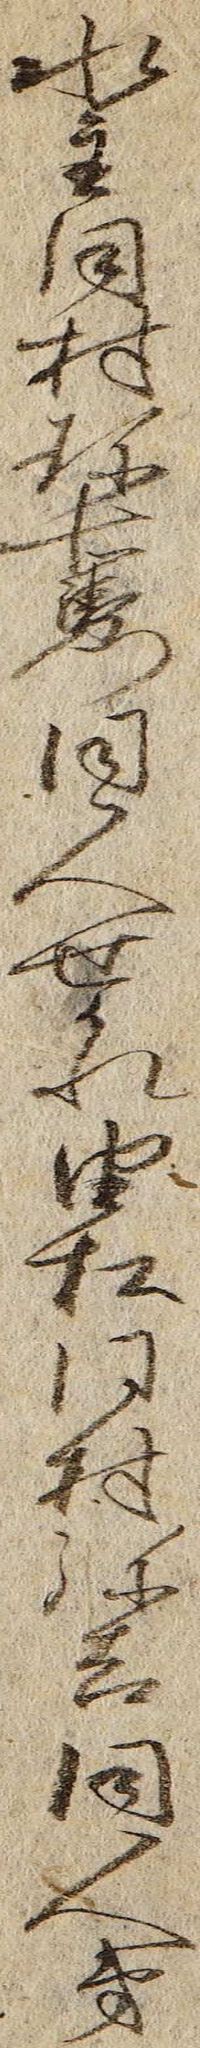水主同村称右衛門同人せかれ由松同村弥吉同人弟
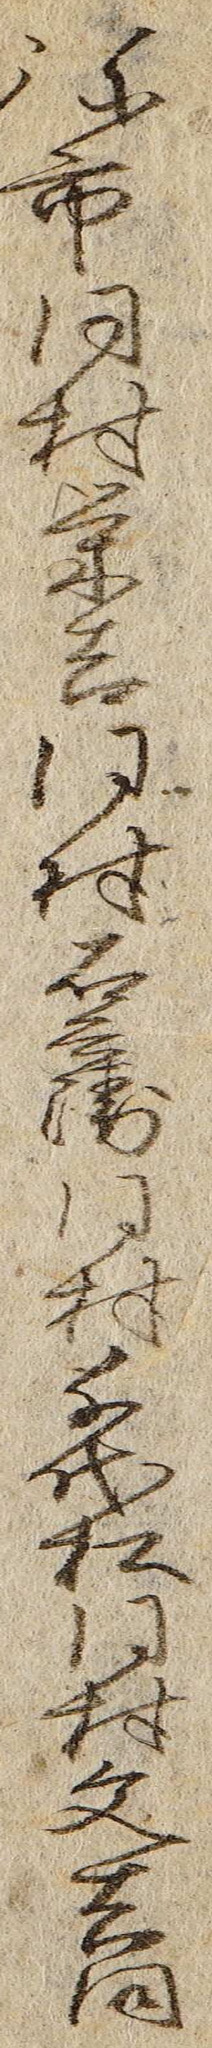弥市同村栄吉同村石兵衛同村千代松同村文吉同
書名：能登国清兵衛異国江漂流之始末
